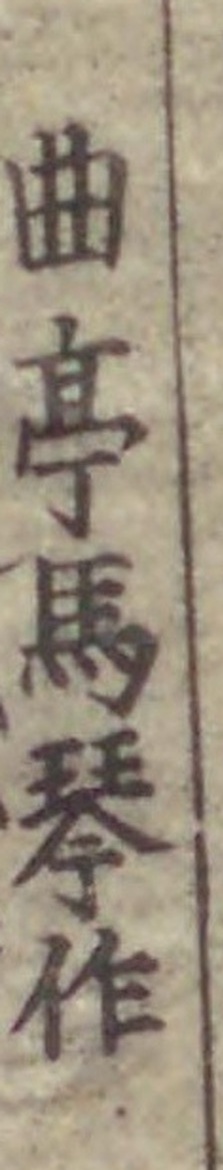曲亭馬琴作
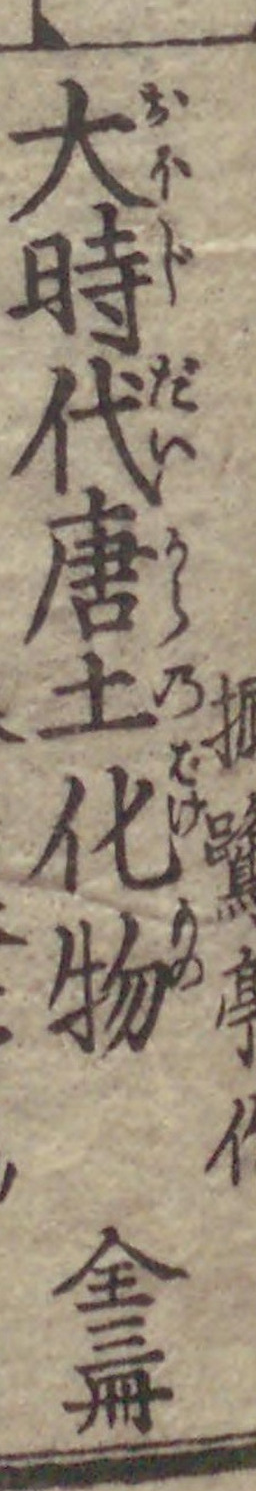大時代唐土化物全三冊
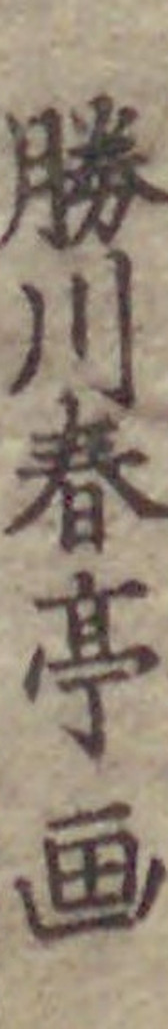勝川春亭画
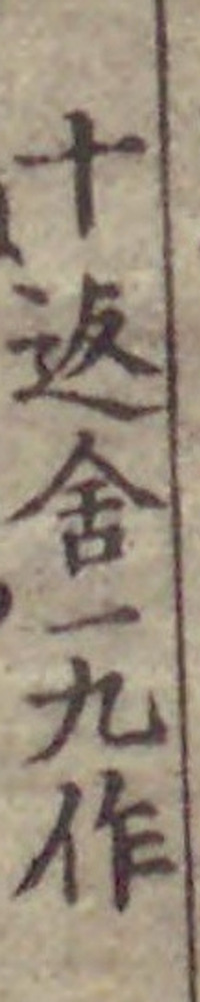十返舎一九作
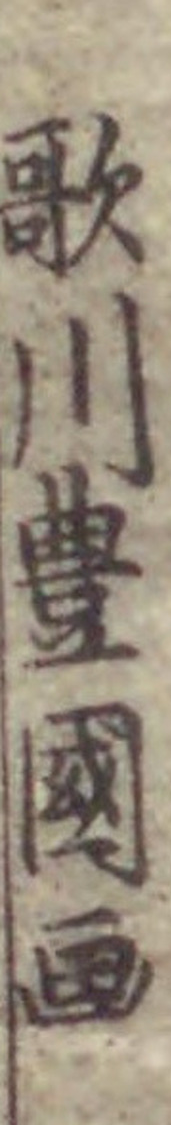歌川豊国画
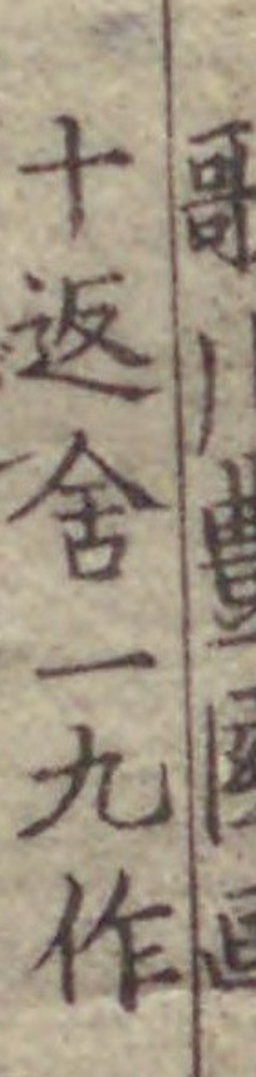十返舎一九作
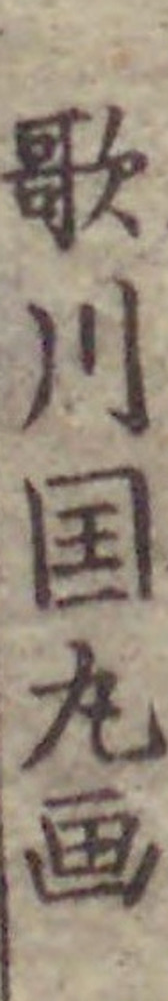歌川国丸画
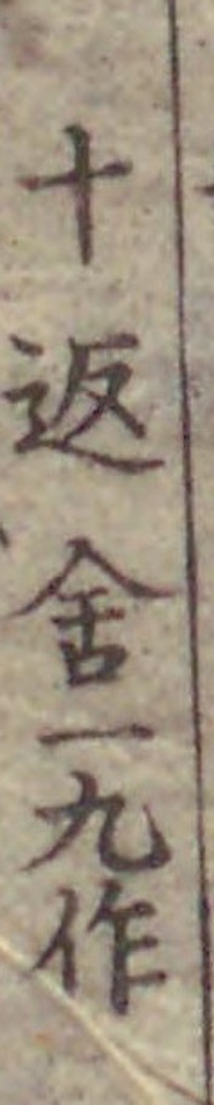十返舎一九作
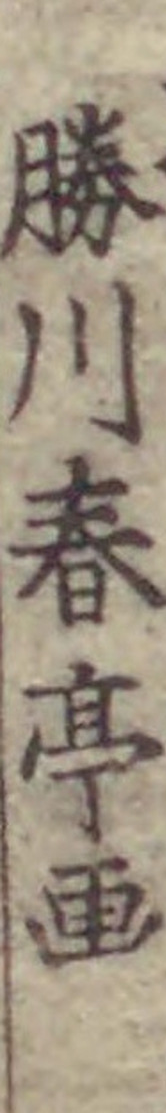勝川春亭画
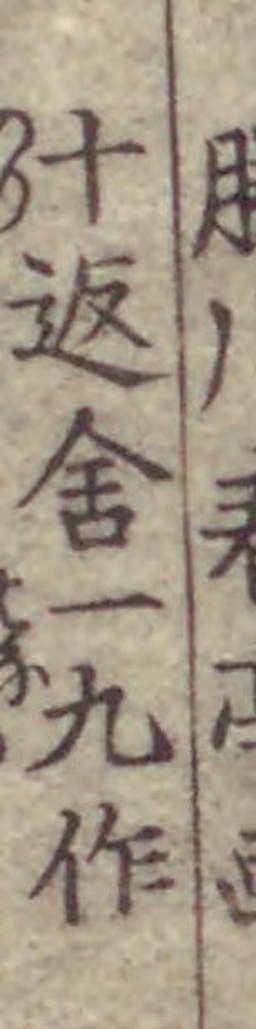十返舎一九作
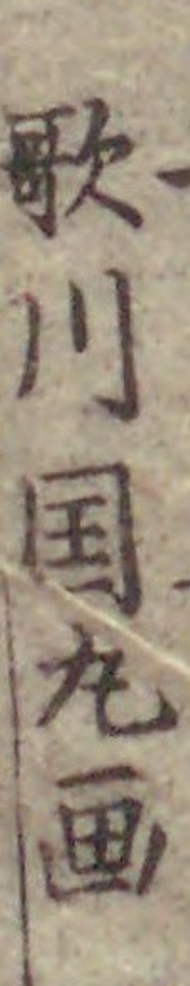歌川国丸画
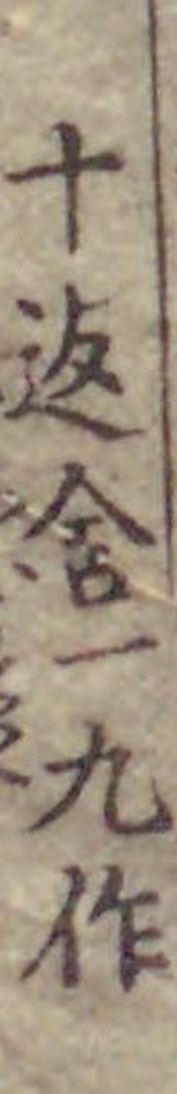十返舎一九作
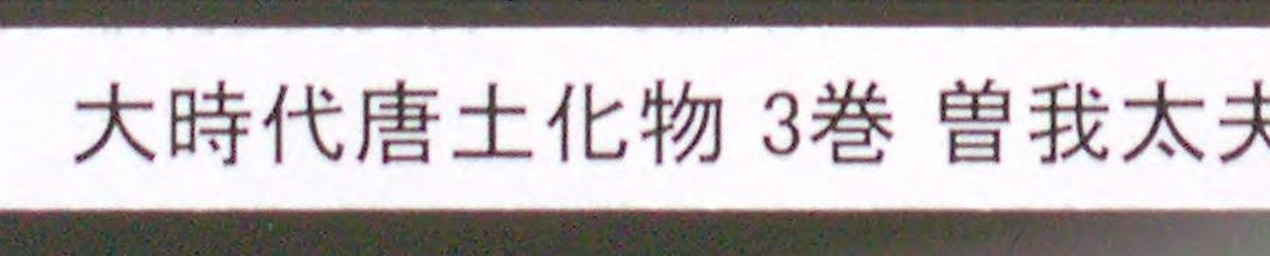大時代唐土化物全三冊
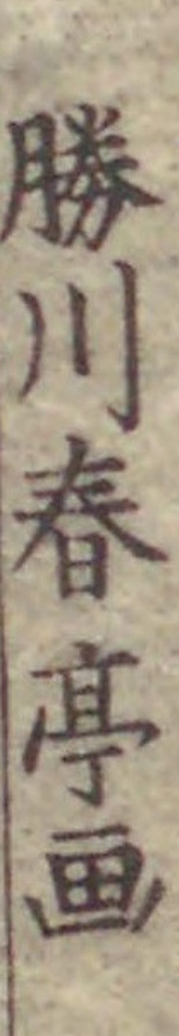勝川春亭画
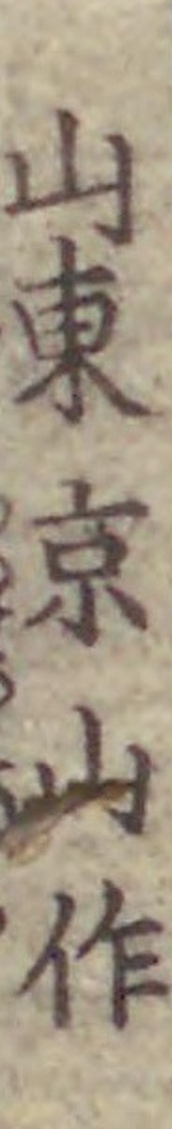山東京山作
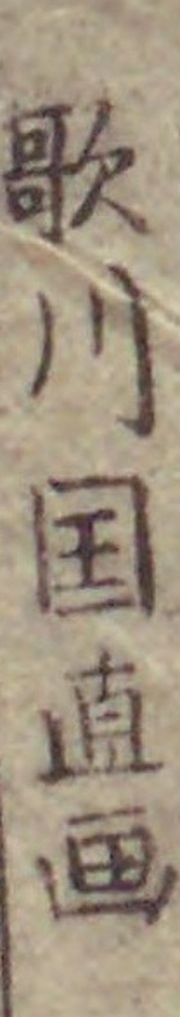歌川国直画
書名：大時代唐土化物 3巻. 曽我太夫染
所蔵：国立国会図書館 National Diet Library, JAPAN
